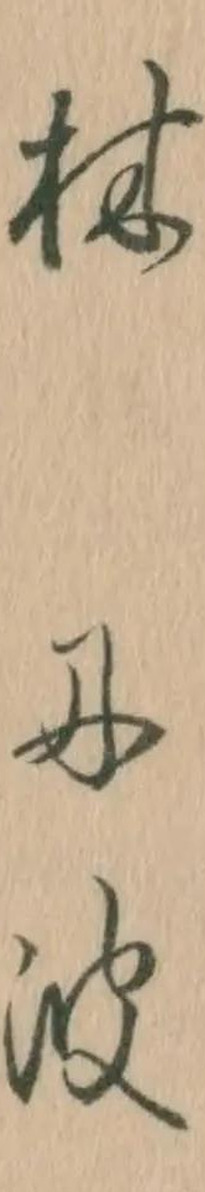林丹波
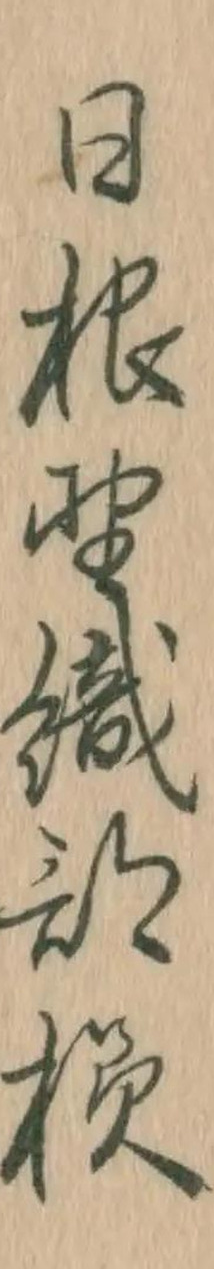日根野織部様
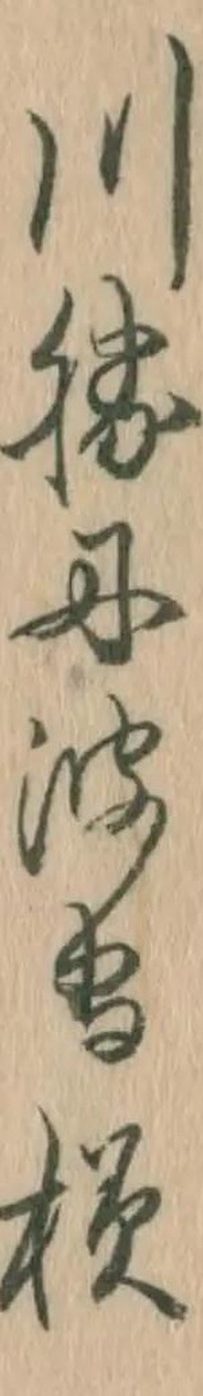川勝丹波守様
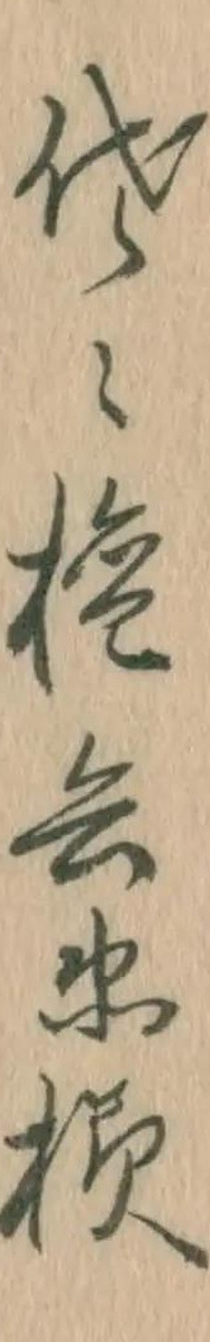佐々権兵衛様
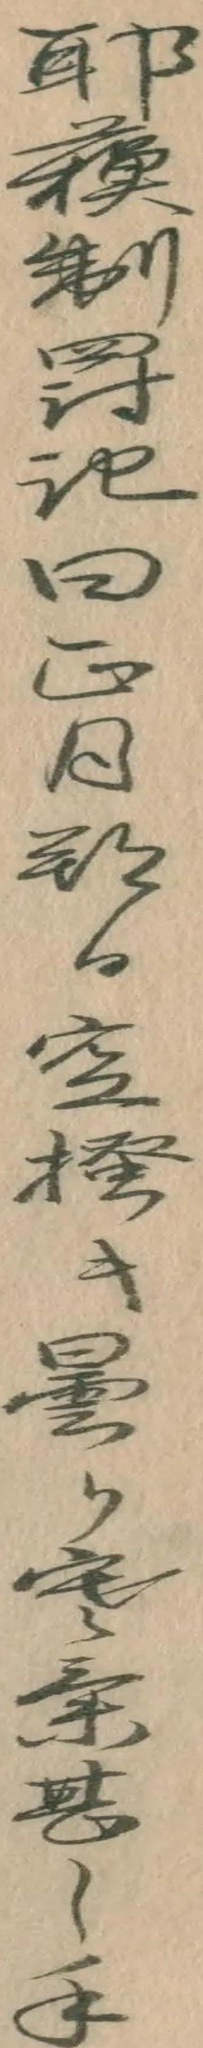耶蘇征罰記曰正月朔日空掻き曇り寒気甚し手
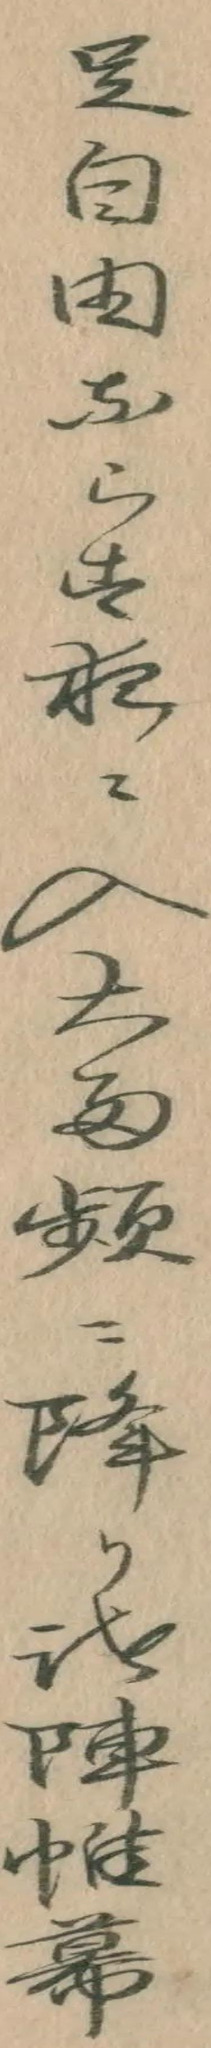足自由なら春夜に入大雨頻に降り諸陣帷幕
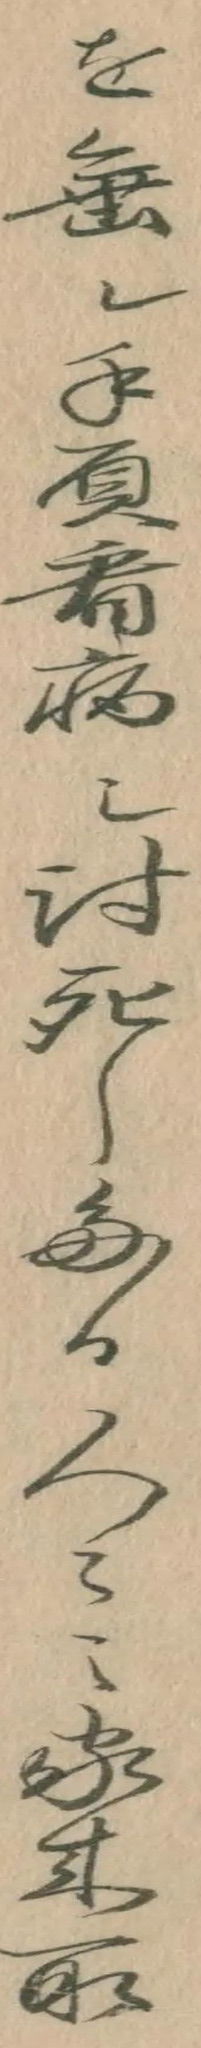を垂し手負看病し討死し多る人々之家来取
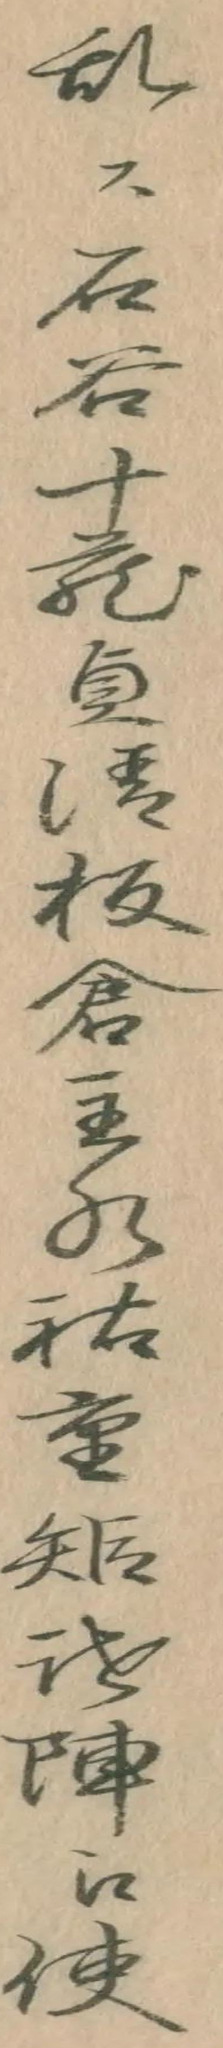乱す石谷十蔵貞清板倉主水祐重矩諸陣江使
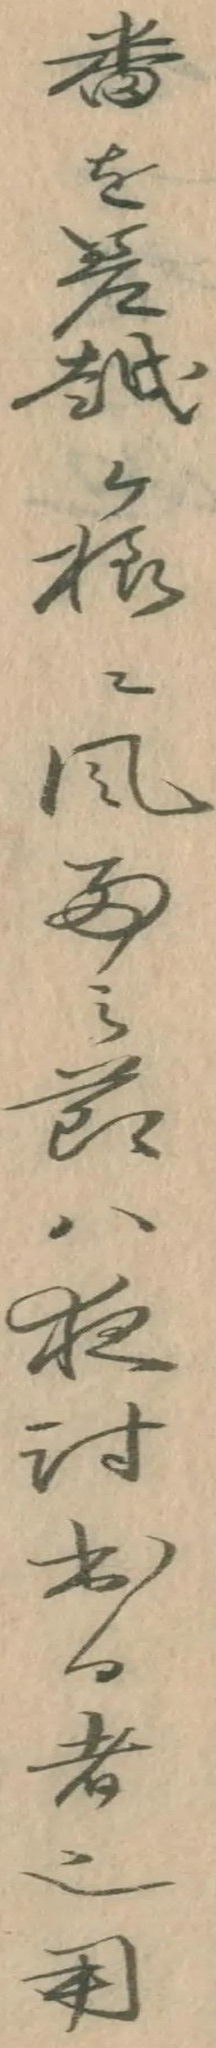番を差越ケ様に風雨之節は夜討出る者也用

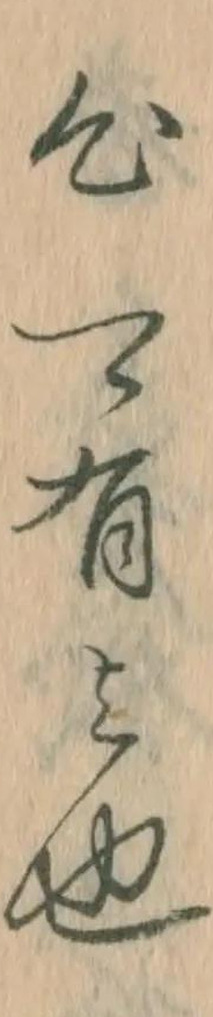心可有之也

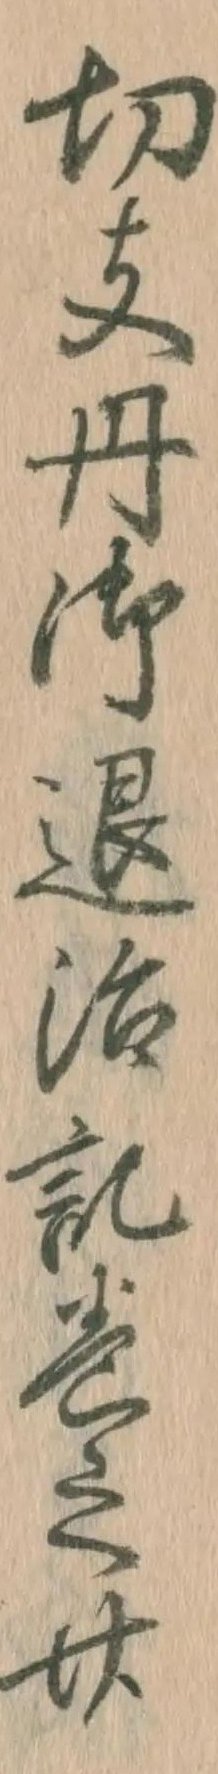切支丹御退治記巻之廿
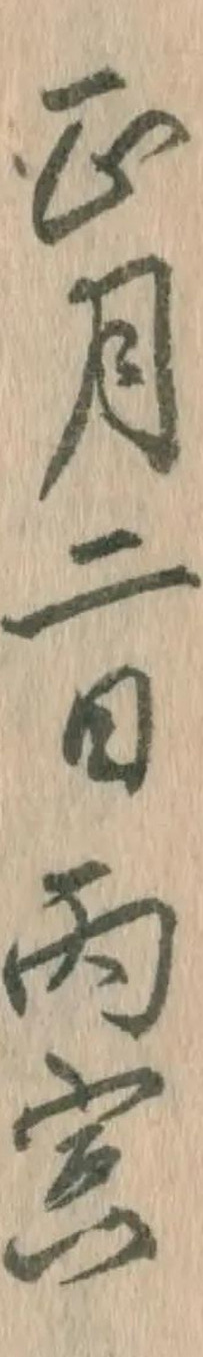正月二日丙寅
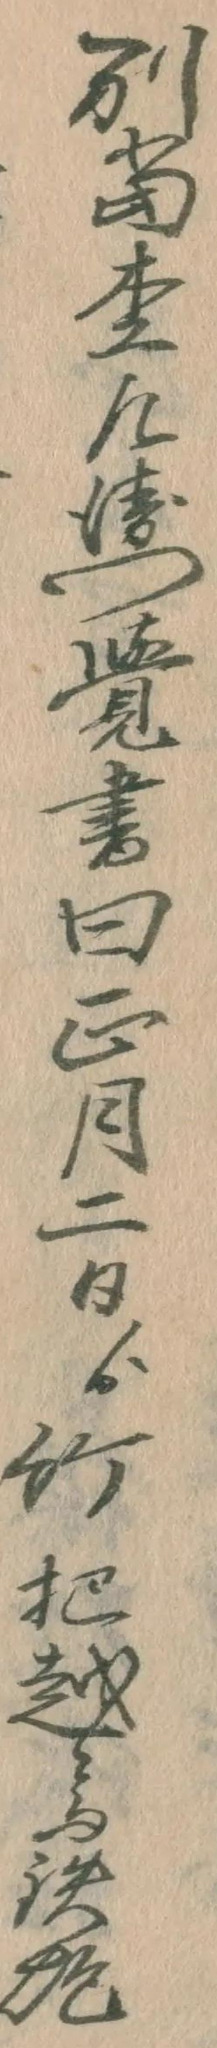別当杢左衛門覚書曰正月二日ゟ竹把越に而鉄砲
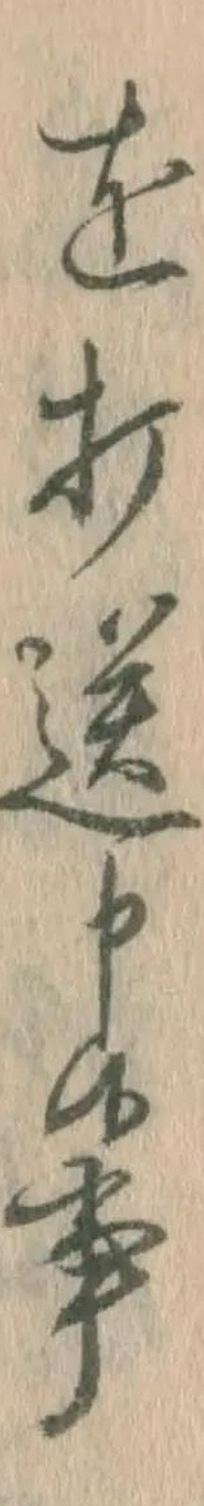を打送申候事
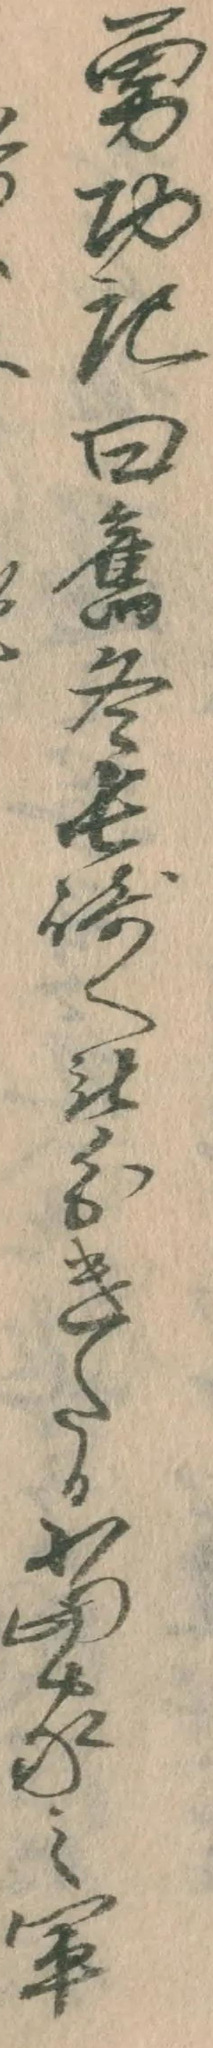勇功記曰舊冬長崎へ被分遣たる当家之軍
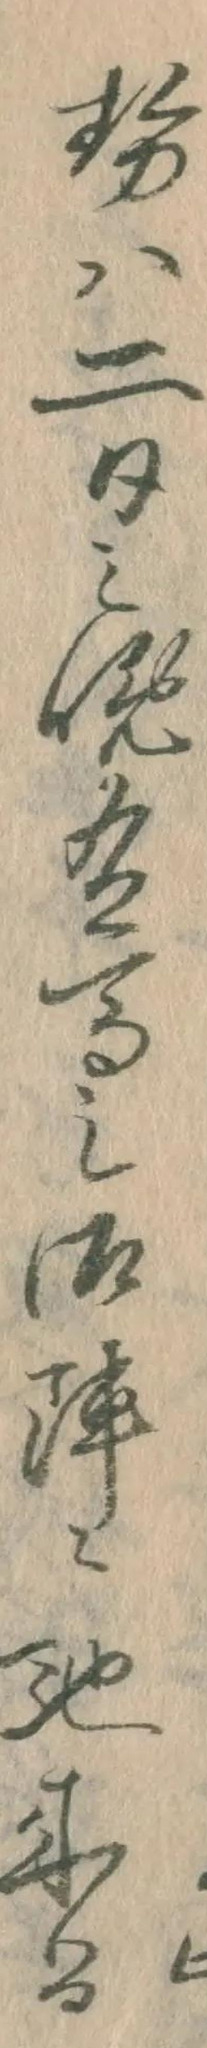勢は二日之晩有馬之御陣に馳来る
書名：切支丹御退治記 49巻. [5]
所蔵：国立国会図書館 National Diet Library, JAPAN
